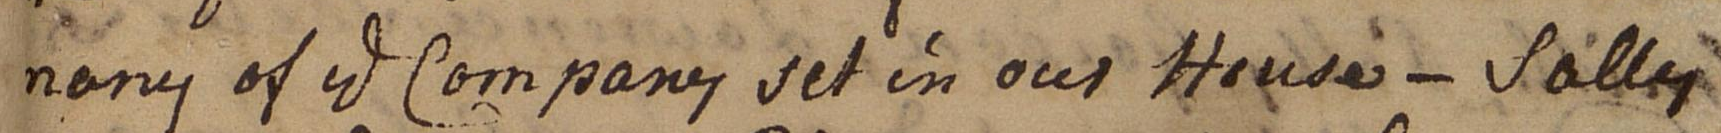nany of y^e Company set in our House- Sally
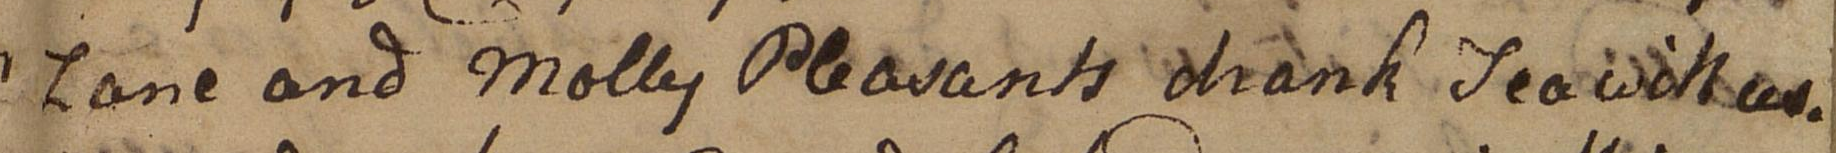Zane and Molly Pleasants drank tea with us
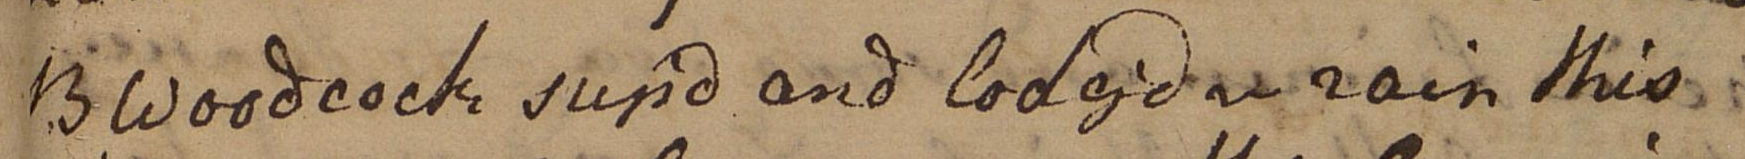B Woodcock sup'd and lodg'd- rain this
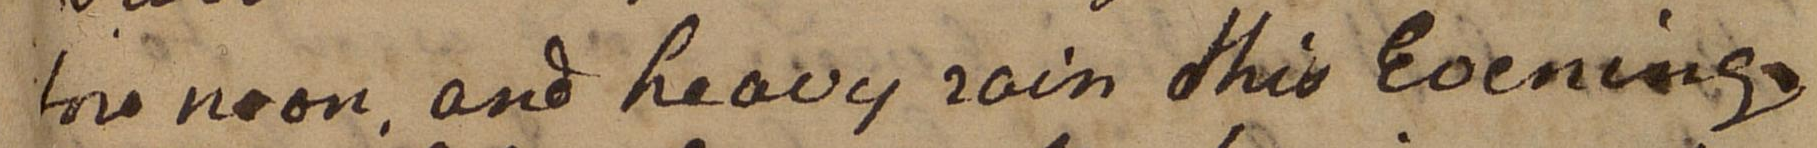fore noon, and heavy rain this Evening.
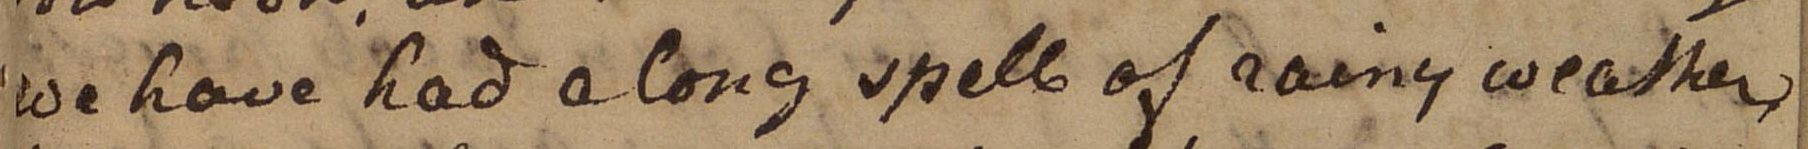we have had a long spill of rainy weather
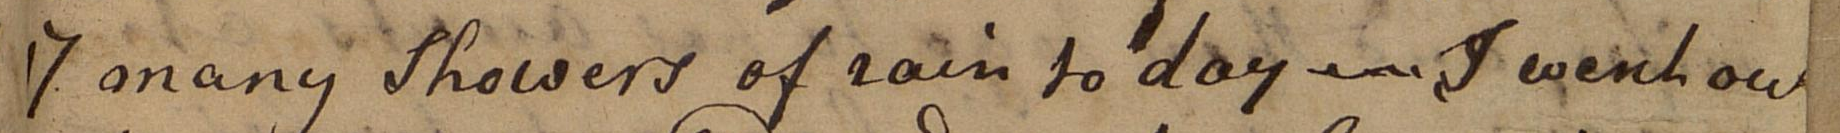17 many Showers of rain to day- I went ou
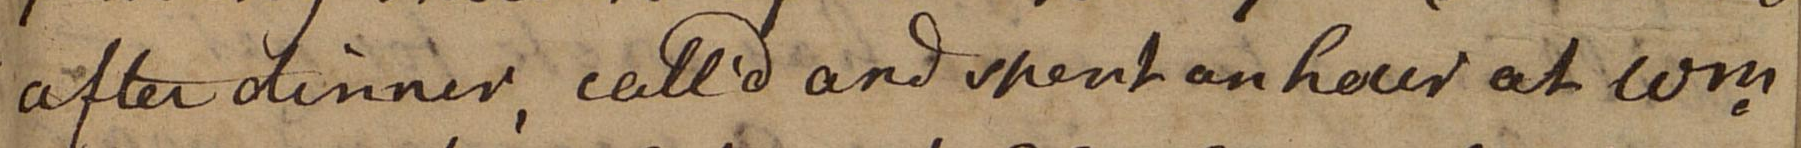after dinner, call'd and spent an hour at W^m.
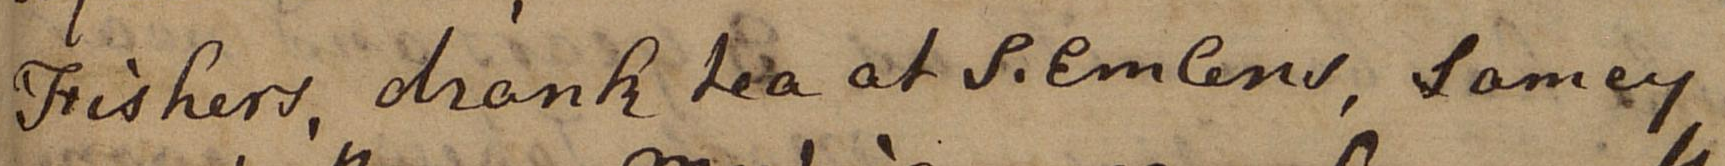Fishers, drank tea at S. Emlens, Samey
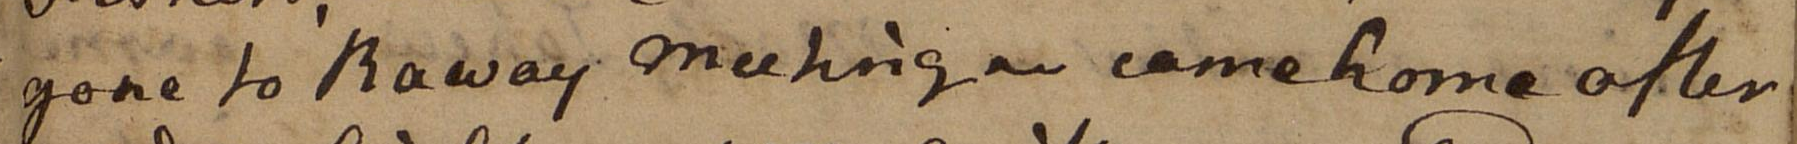gone to Raway meeting- came home after
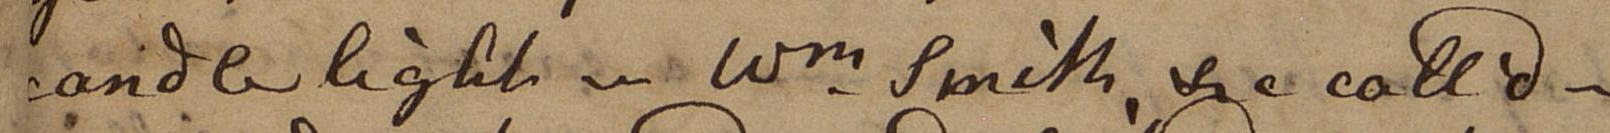candle light- W^m. Smith, &c call'd
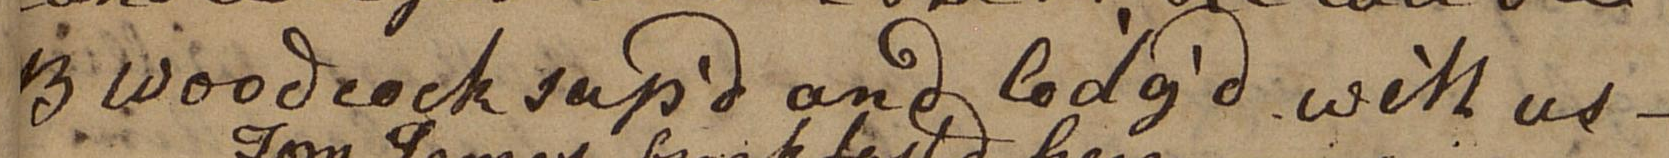B Woodcock sup'd and lodg'd with us
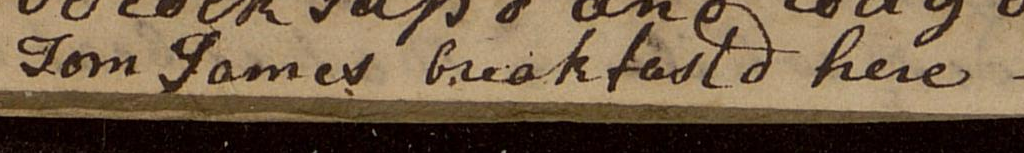Tom James breakfastd here
